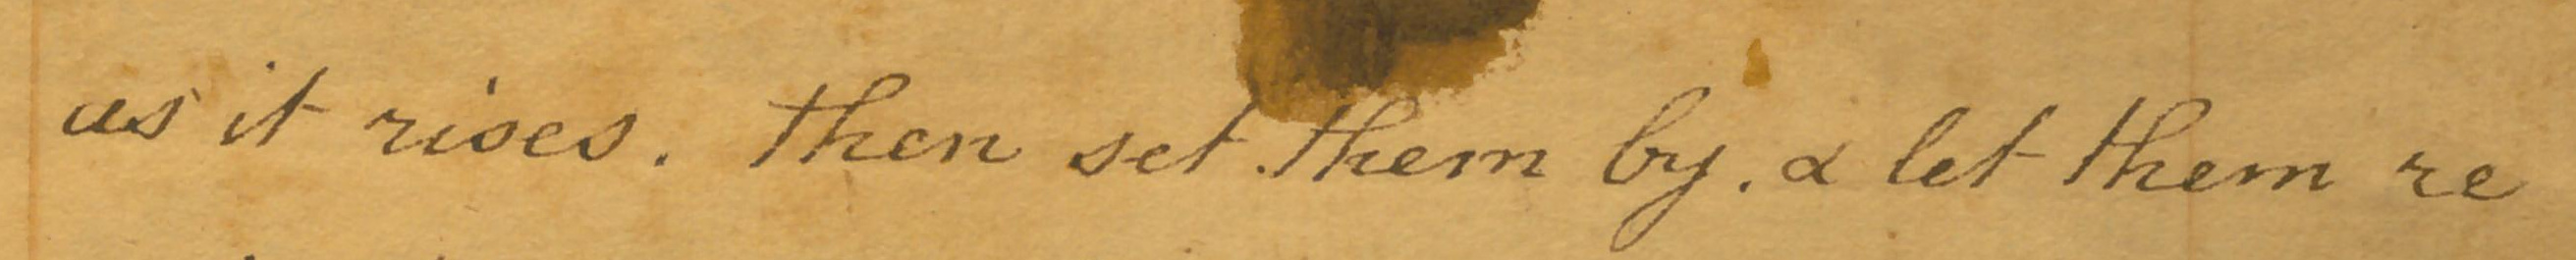as it rises. then set them by. & let them re
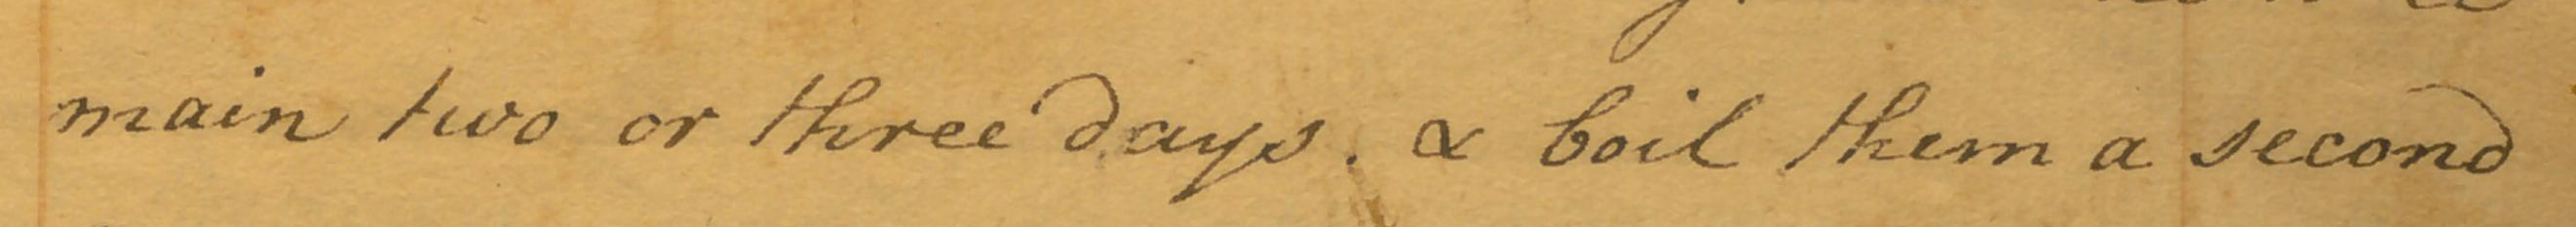main two or three days. & boil them a second
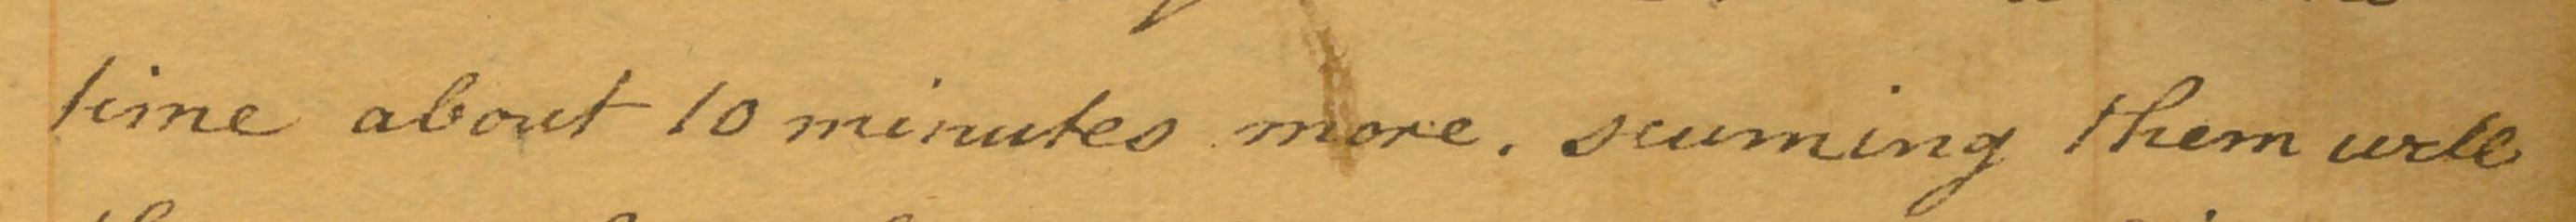time about 10 minutes more. scuming them well
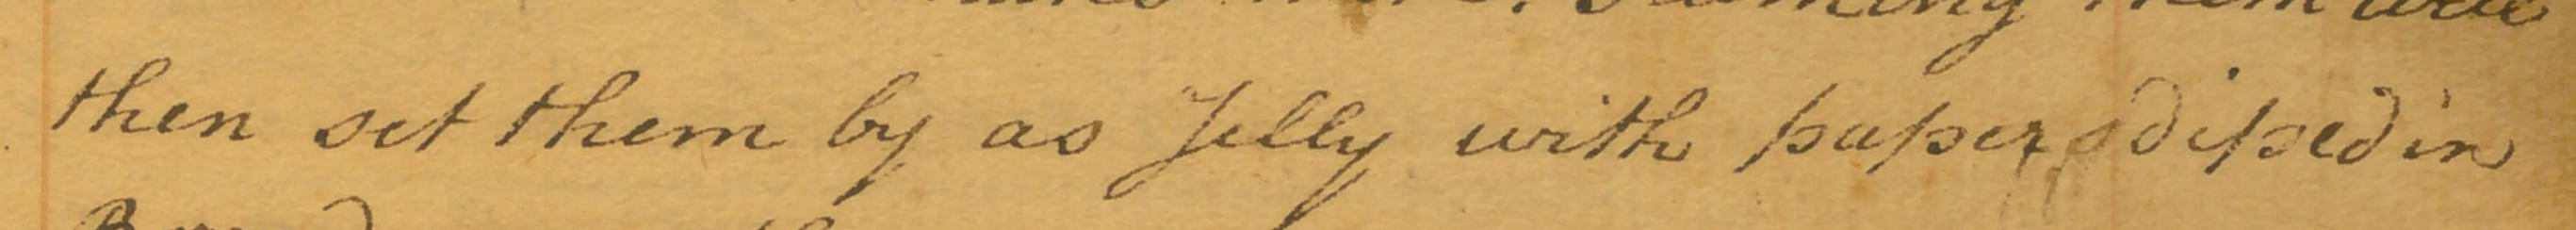then set them by as Jelly with paper diped in
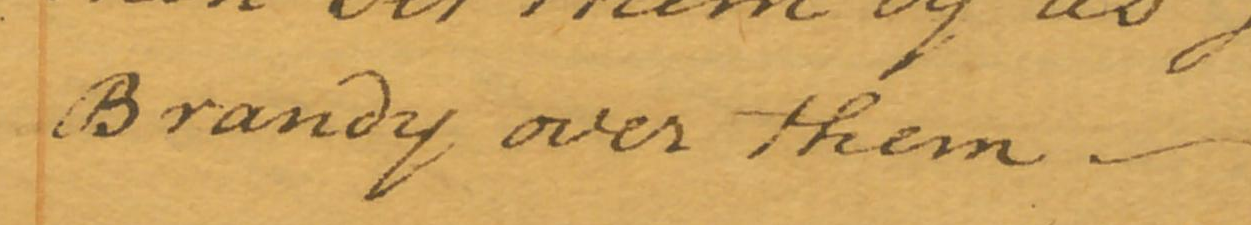Brandy over them-
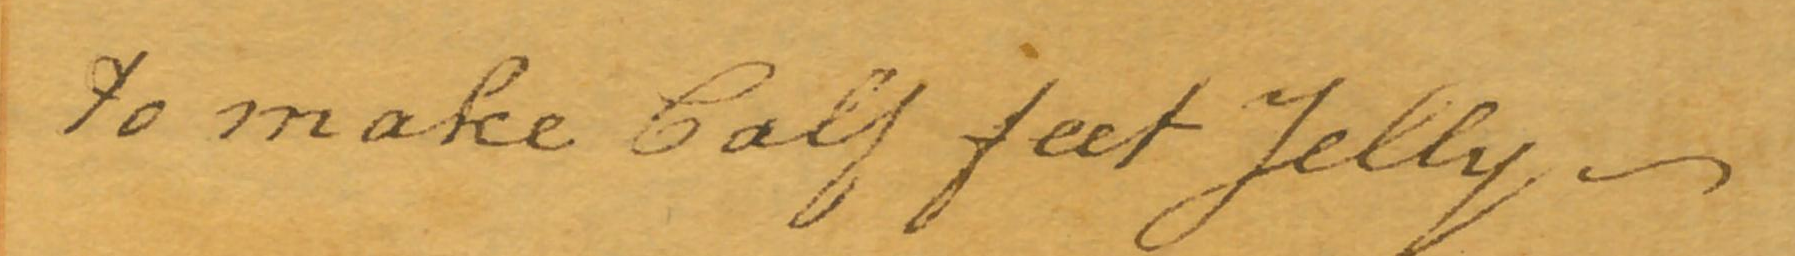to make Calf feet Jelly
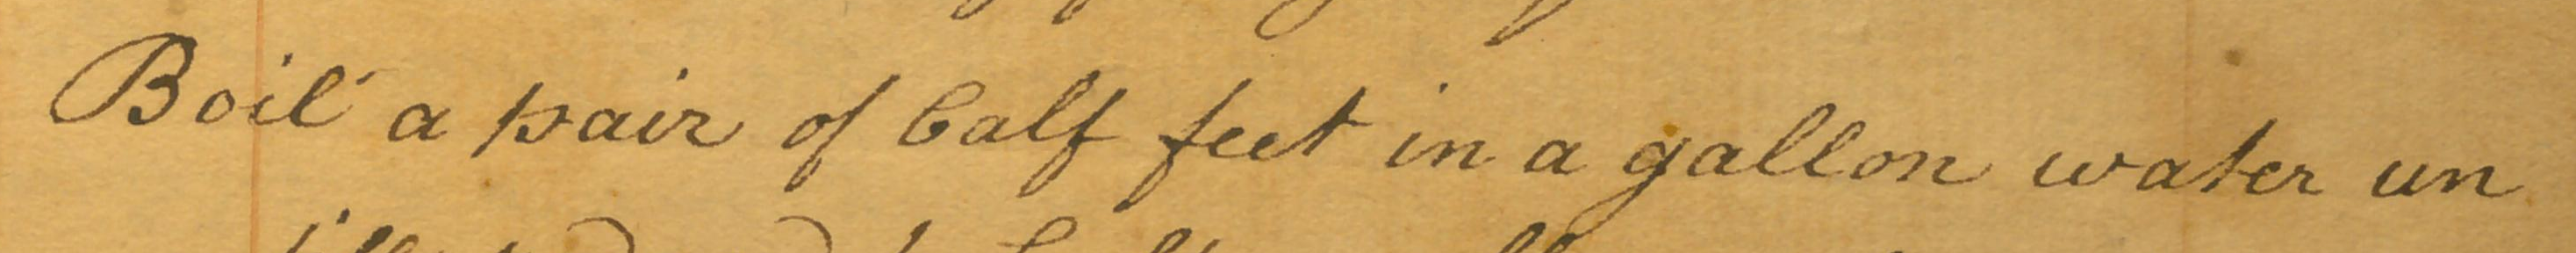Boil a part of Calf feet in a gallon water un
